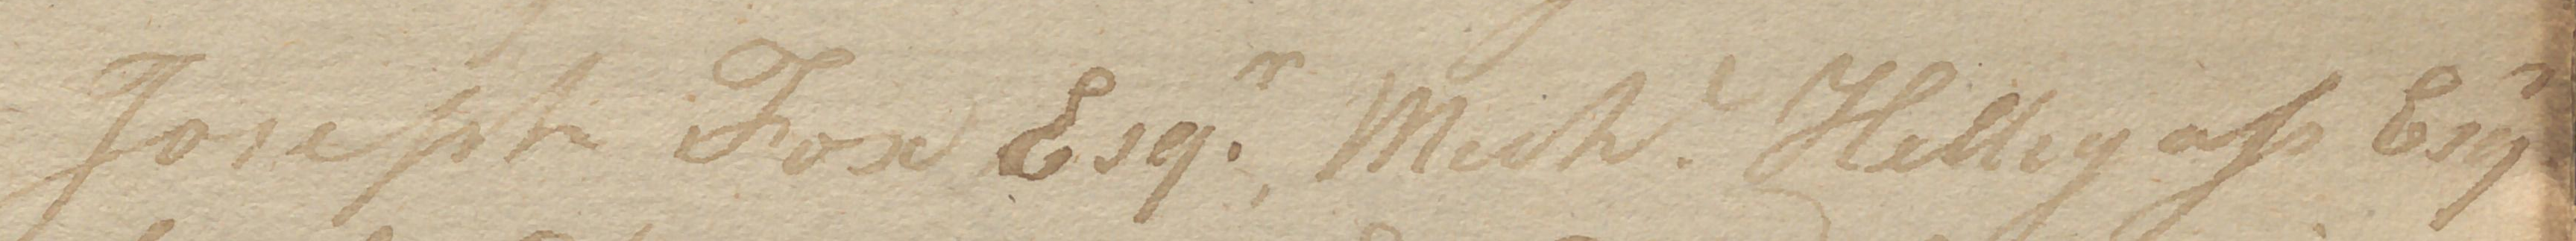Joseph Fox Esq^r. Mich^l. Hillegass Esq^r.
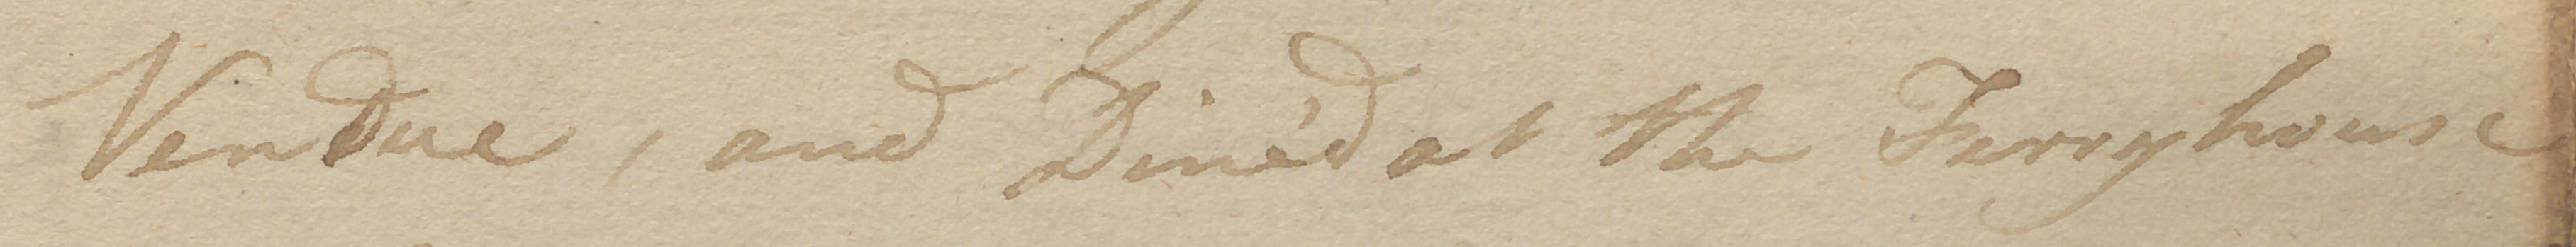Vendue and Dine'd at the Ferryhouse
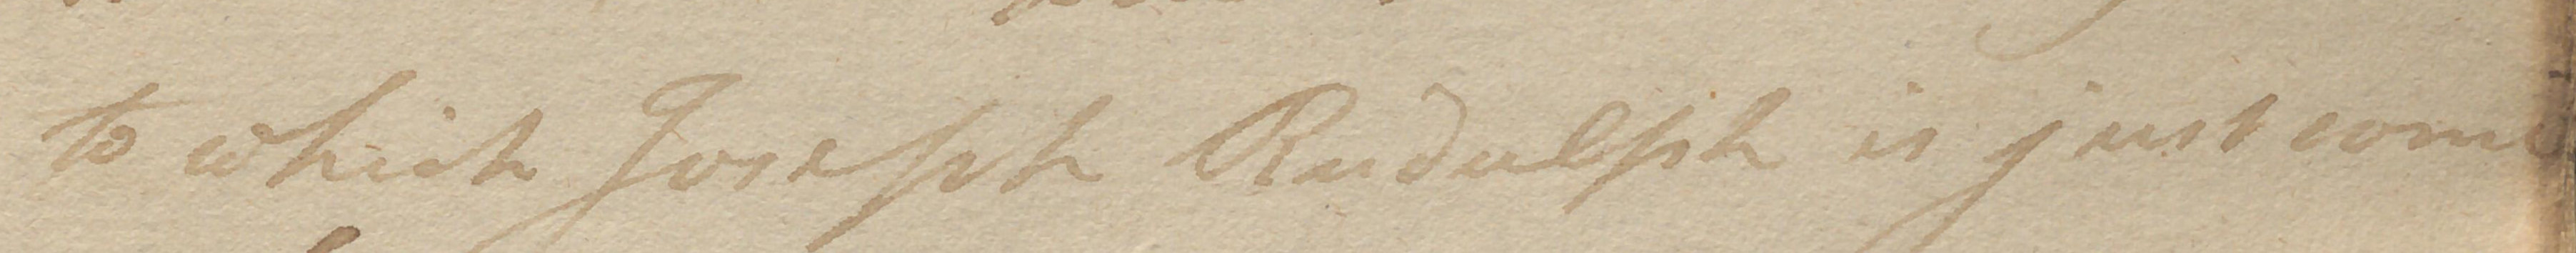to which Joseph Rudolph is just come
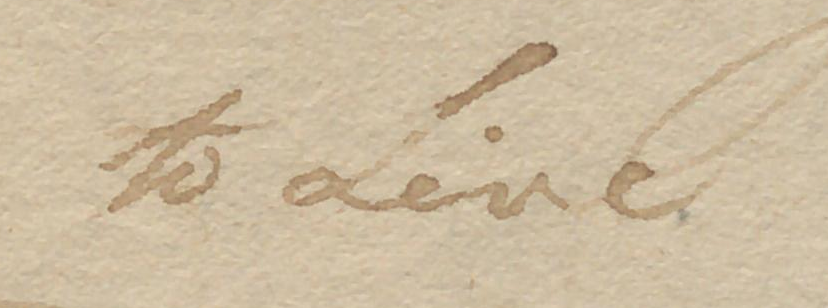to Live
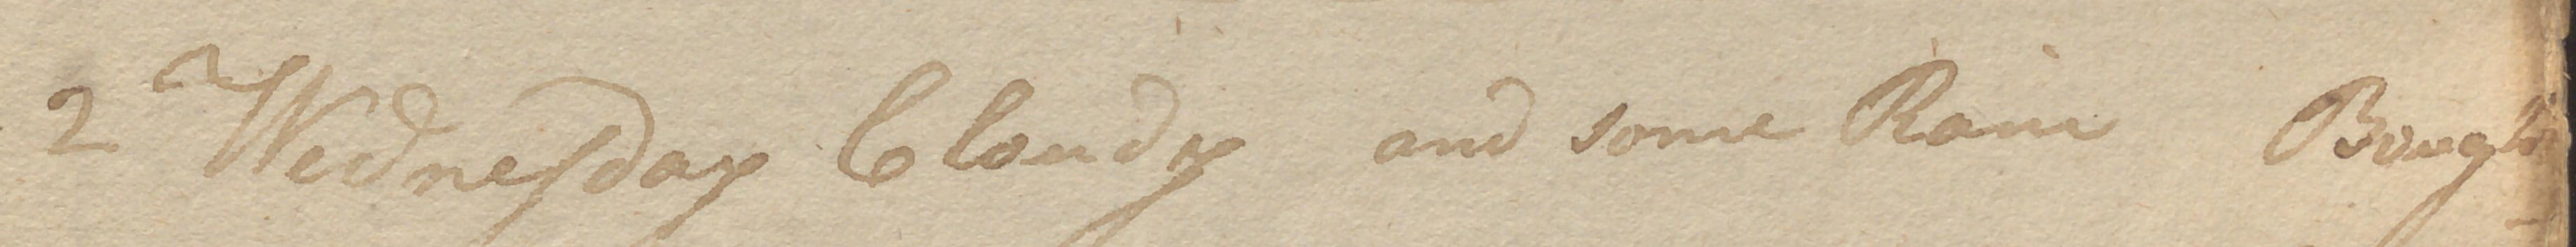2 Wednesday Cloudy and some Rain Bought
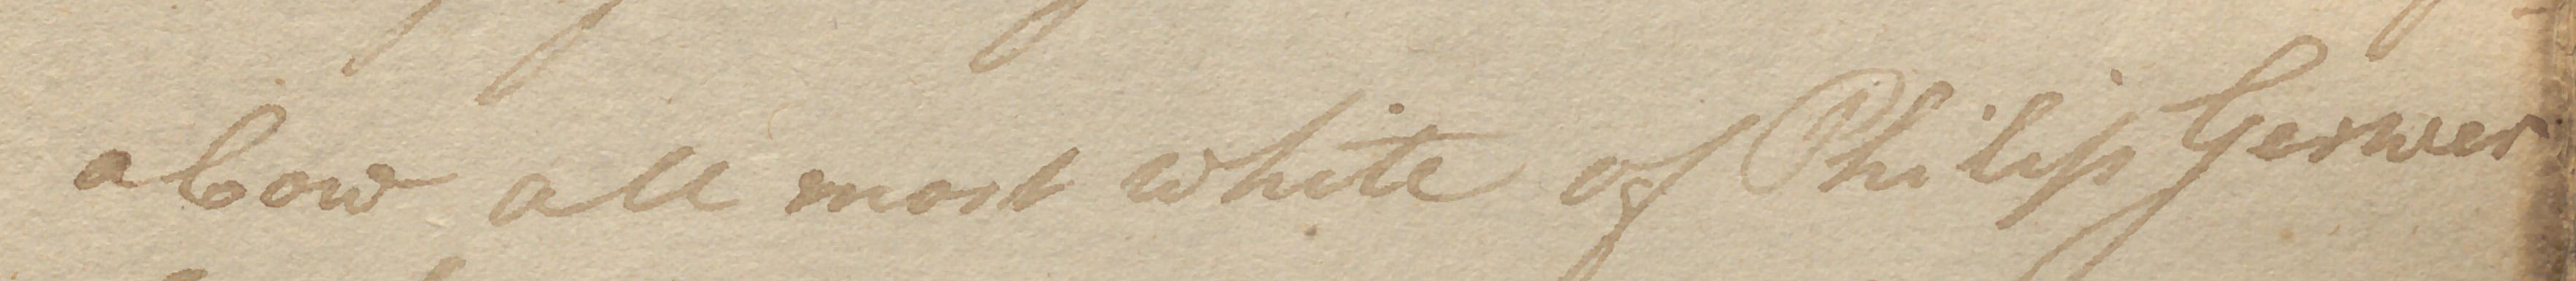a Cow all most white of Philip Gerwer
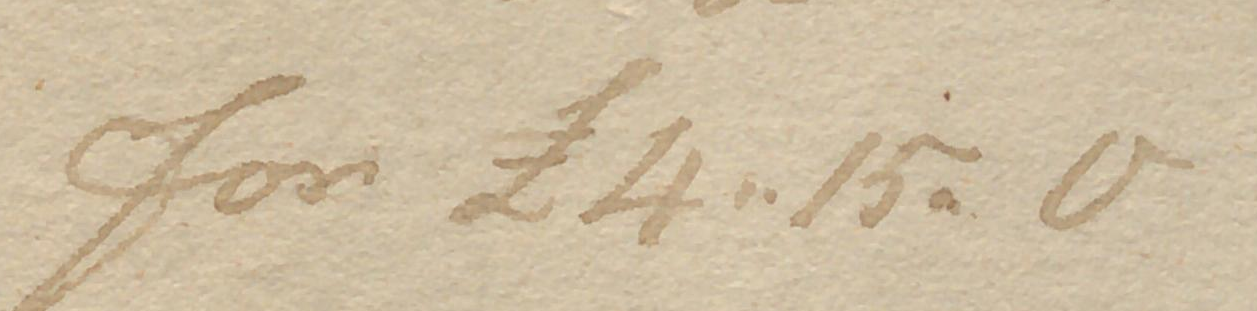for £4.15.0
